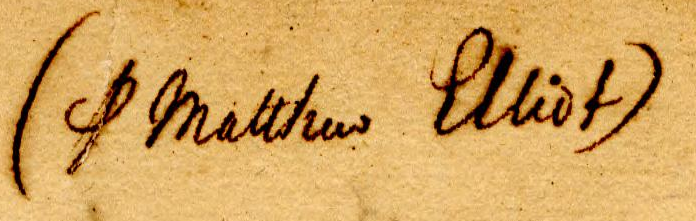(Per Matthew Elliot)
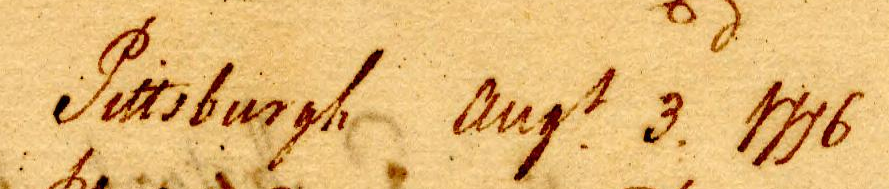Pittsburgh Aug^t. 3. 1776
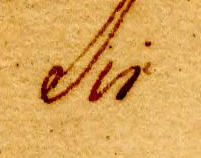Sir
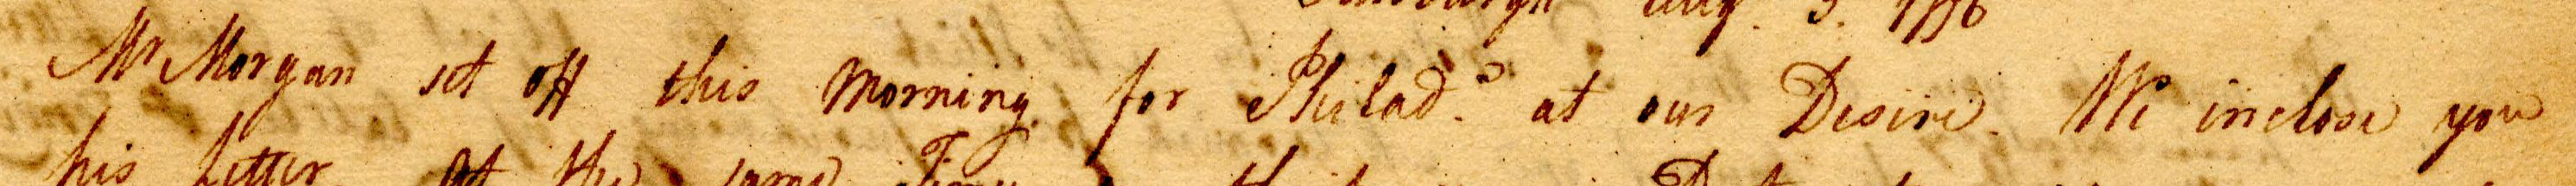M^r Morgan set off this morning for Philad^a. at our Desire. We inclose you
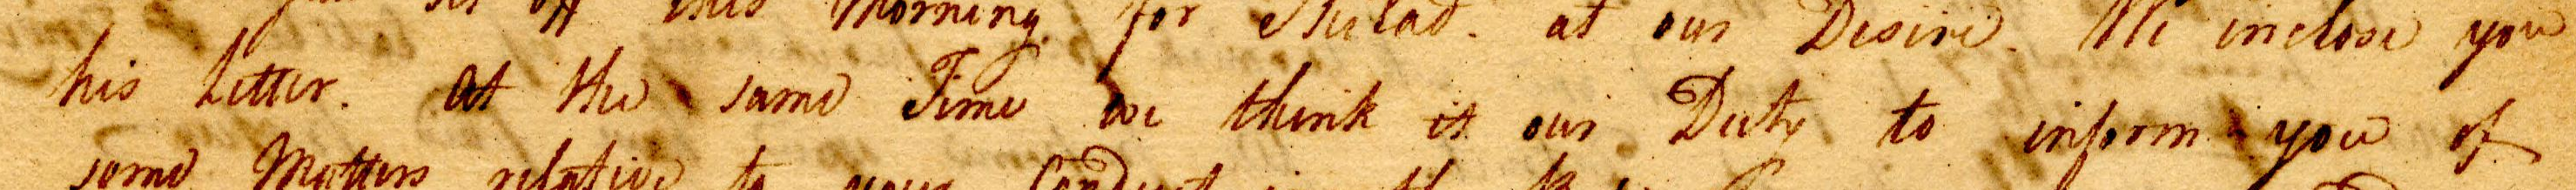his Letter. At the same Time we think it our Duty to inform you of
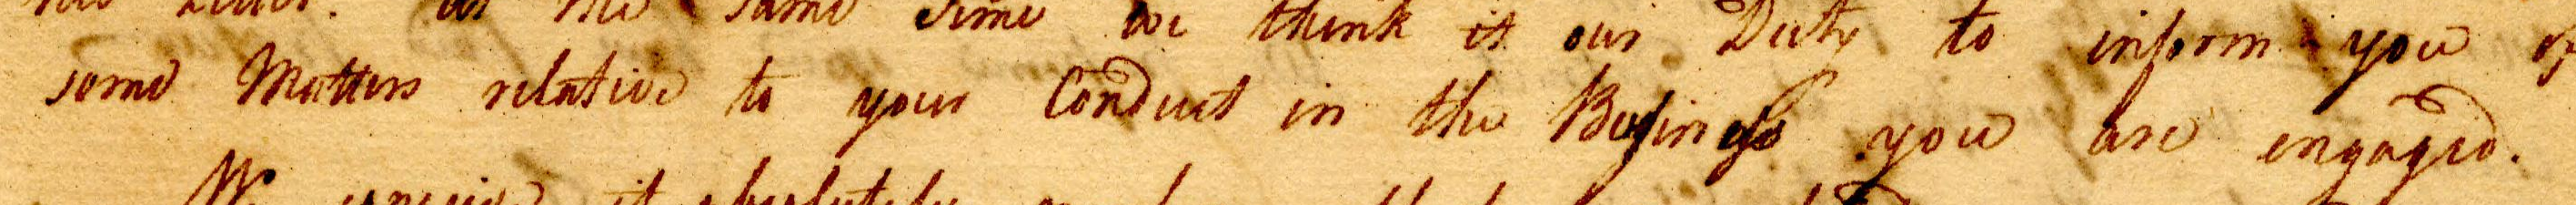some Matters relative to your Conduct in the Business you are engaged.
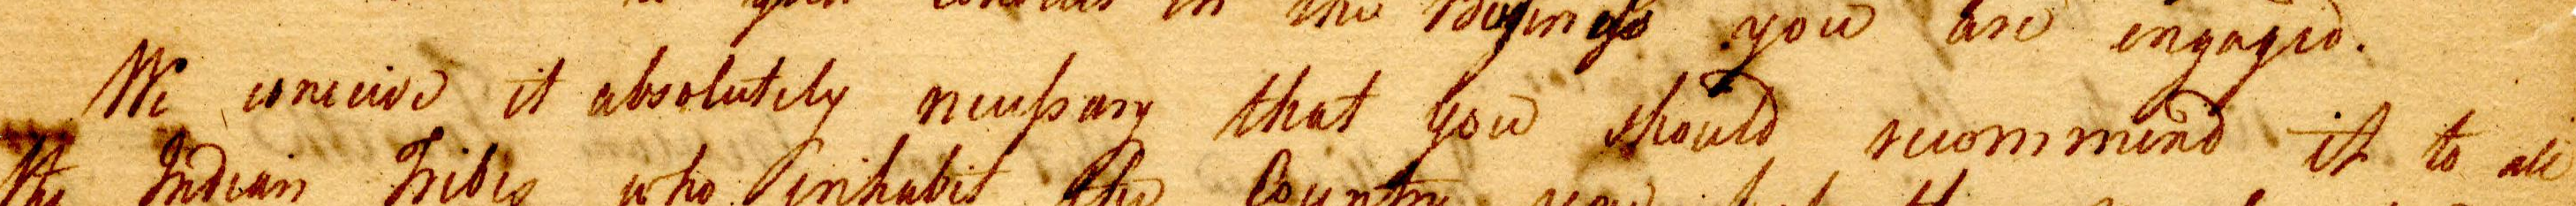We conceive it absolutely necessary that you should recommend it to all
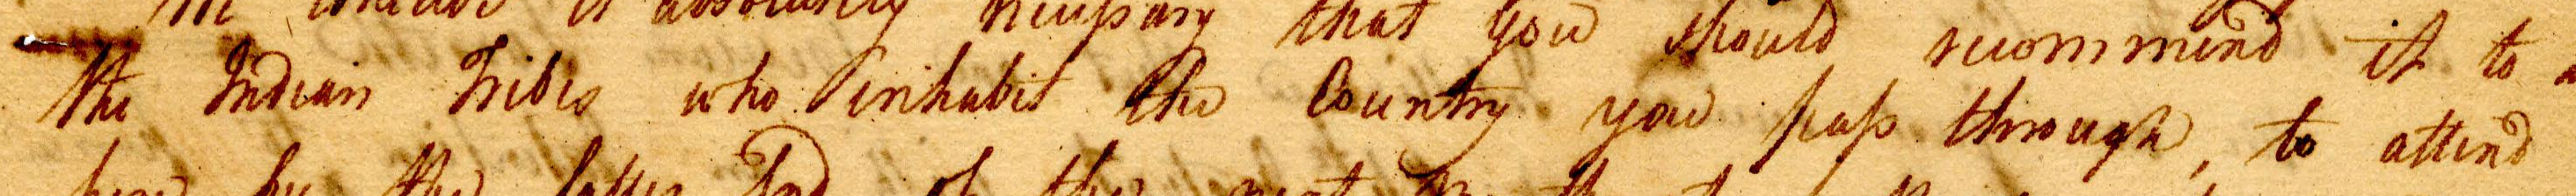the Indian Tribes who inhabit the Country you pass through, to attend
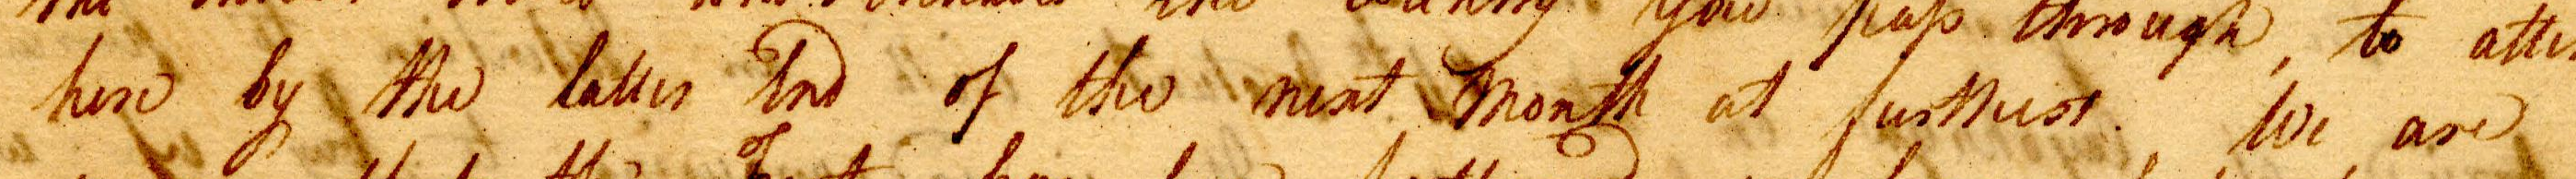here by the latter End of the next Month at furthest. We are
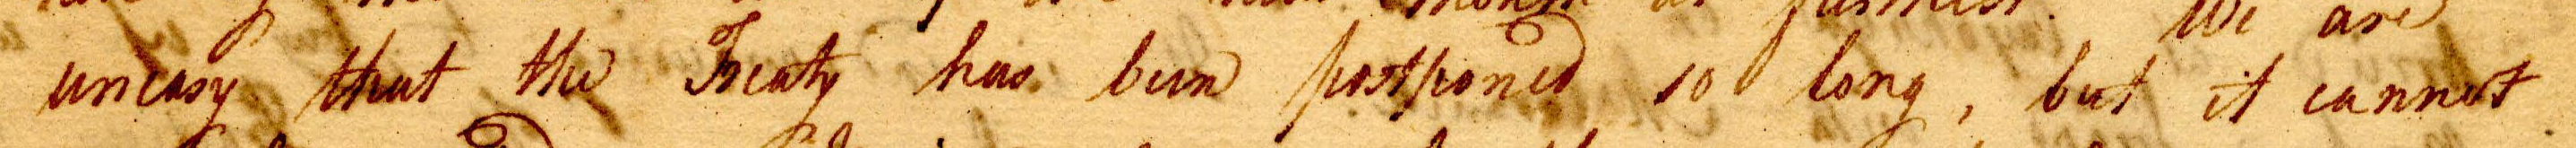uneasy that the Treaty has been postponed so long, but it cannot
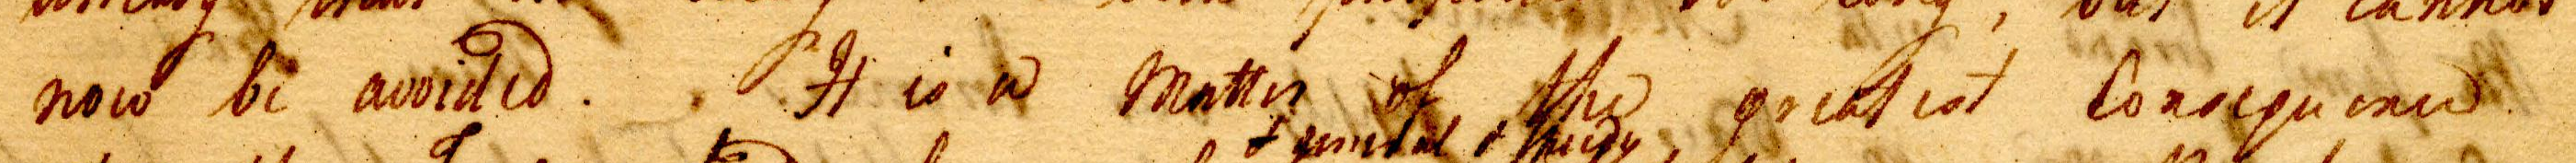now be avoided. It is a matter of the greatest Consequence.
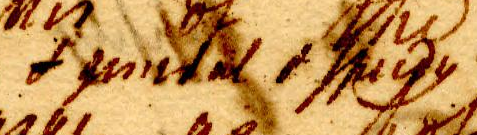& general & speedy
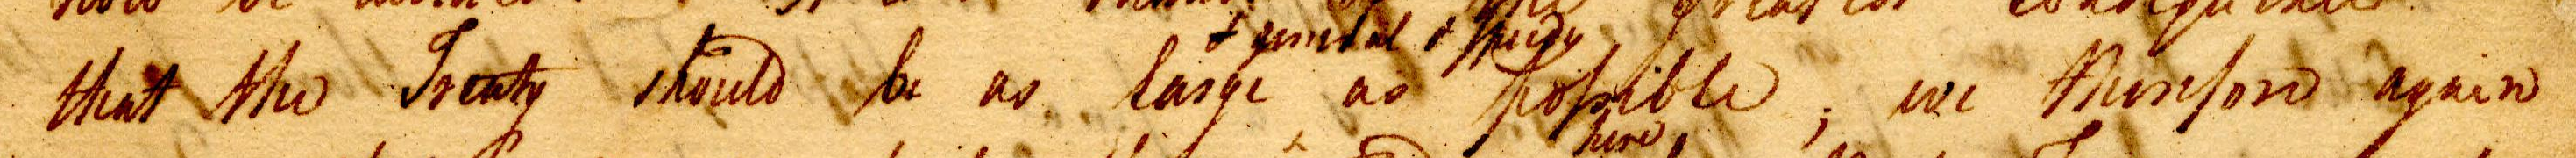that the Treaty should be as large^ as possible; we therefore again
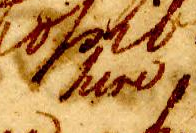here
